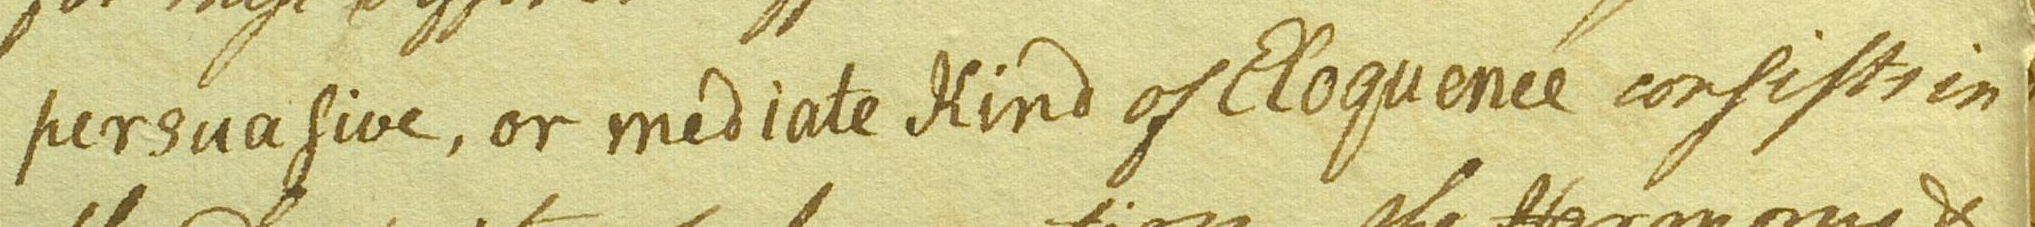persuasive, or mediate kind of Eloquence consists in
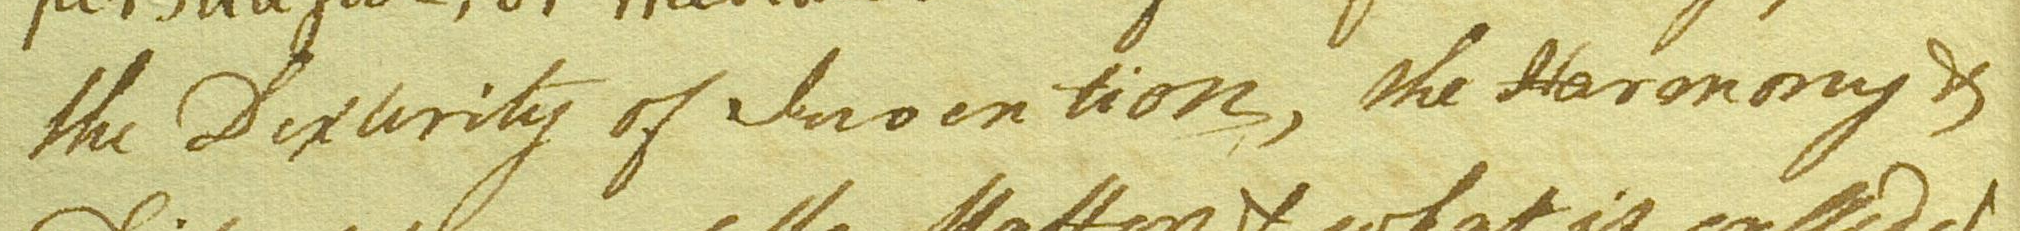the Dexterity of Invention, the Harmony &
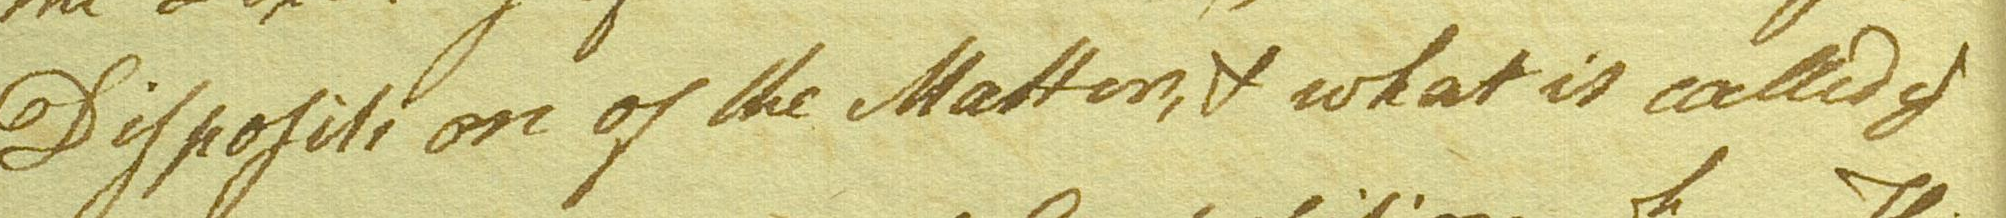Disposition of the Matter, & what is called y^e
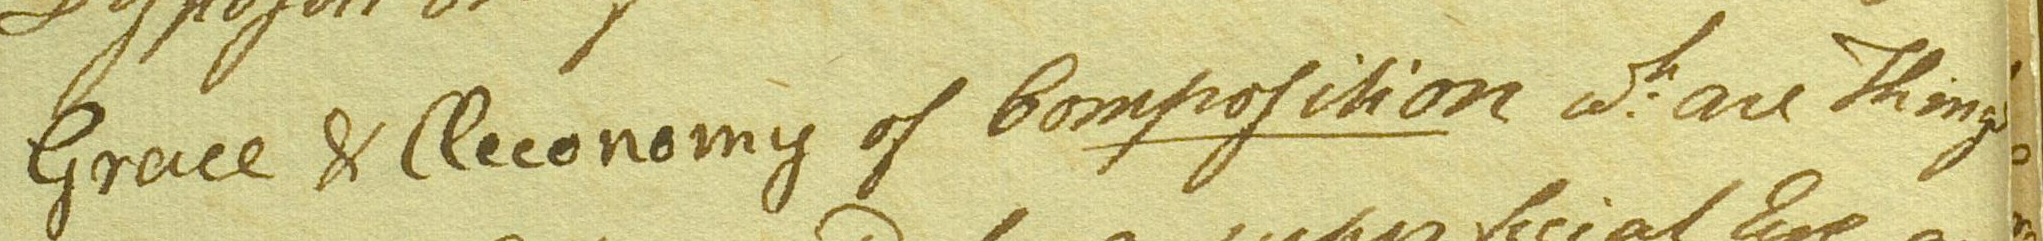Grace & OEconomy of Composition w^h: are Things
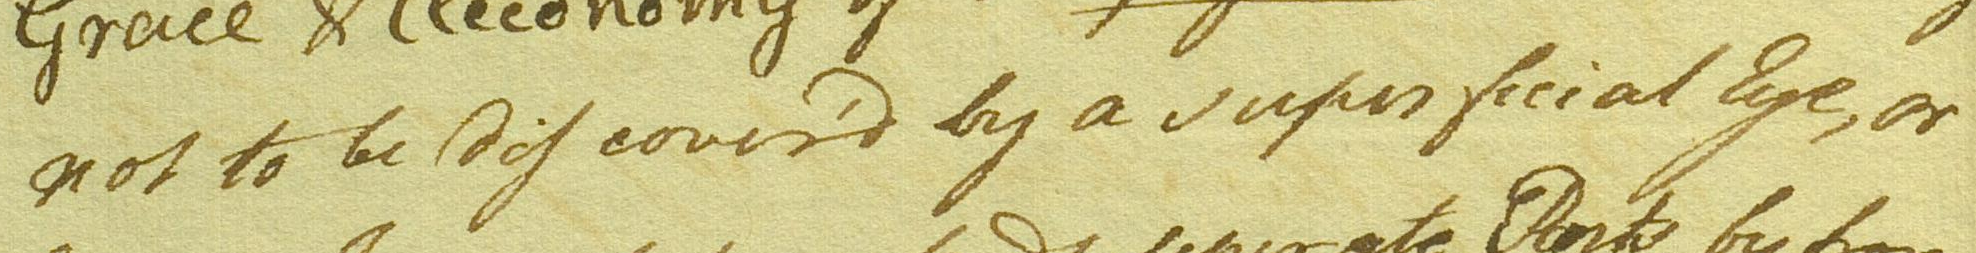not to be discover'd by a superficial Eye, or
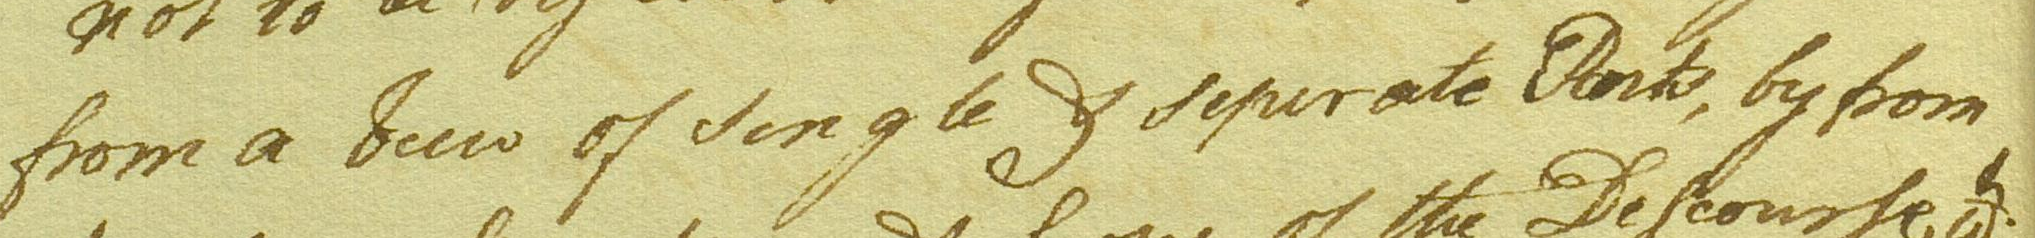from a slew of single & separate Parts, by from
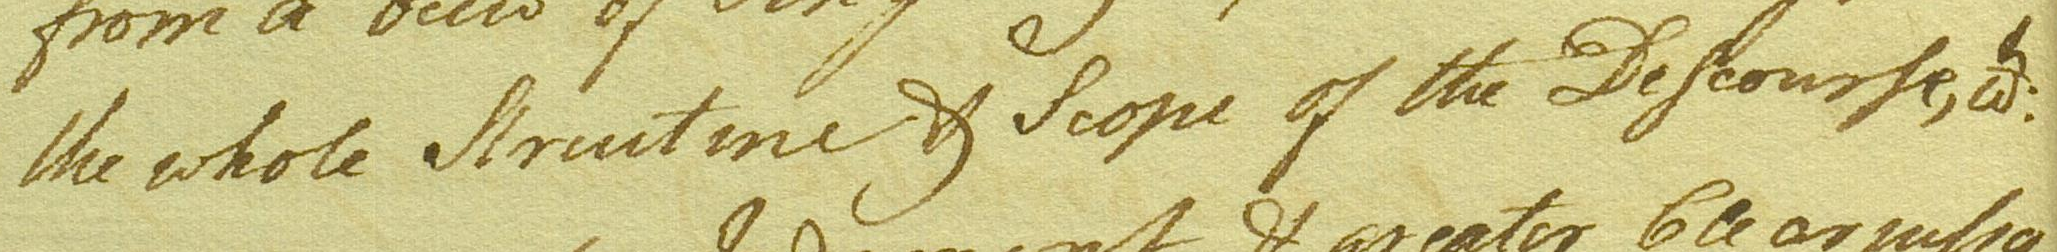the whole Structure & Scope of the Descourse, w^h
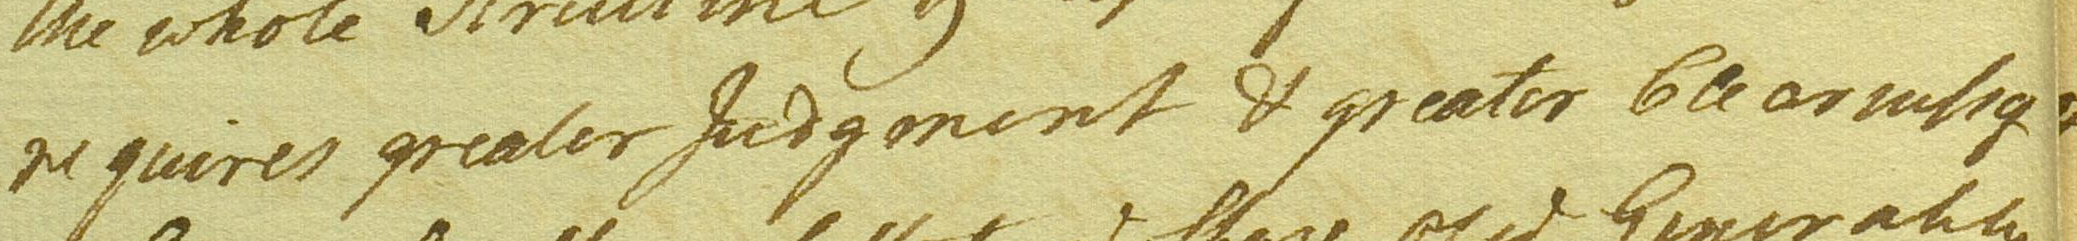requires greater Judgment & greater Charming
